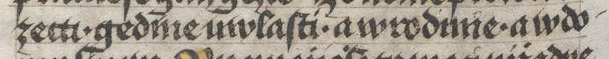ze cti.gedine vwlaſti.a wrodinie.a w do¬
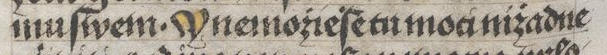mu ſwem. Y nemożíeẛe tu moci niżadne
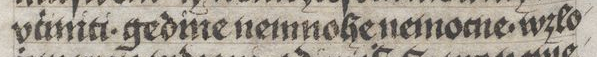uċiniti.gedine nemnohe nemocne wzlo¬
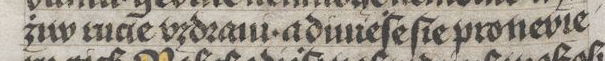żiw ruce vzdraui.a diwieẛe ſie pro nevie¬
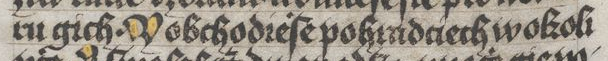ru gich.Y obchodíeẛe po hradciech w okoli
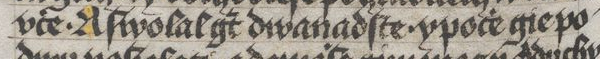vċe. A ſwolal ḡt dwanadſte.y poċe gie po¬
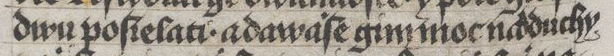dwu poſielati.a dawaẛe gim moc nad duchy
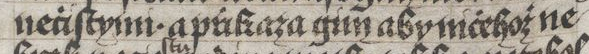neċiſtymi.a pṙikaza gim aby niċehoż ne¬
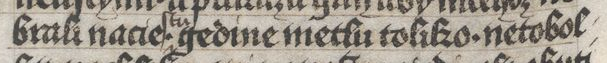brali na cieſtu gedine metlu toliko.netobol¬
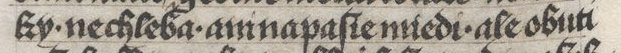ky.nechleba.ani napaſié medi.ale obutí
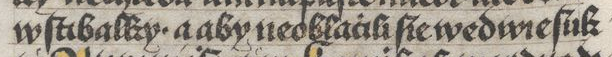wſtibalky.a aby neoblaċili ſie we dwie ſuk¬
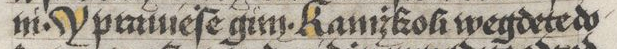ni.Y prauíeẛe gim.Kamżkoli wegdete do
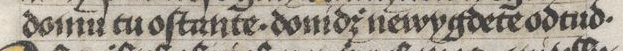domu tu oſtante.donidž newygdete odtud.
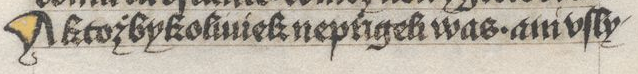A ktożby koliwiek nepṙigeli was. ani vſly¬
